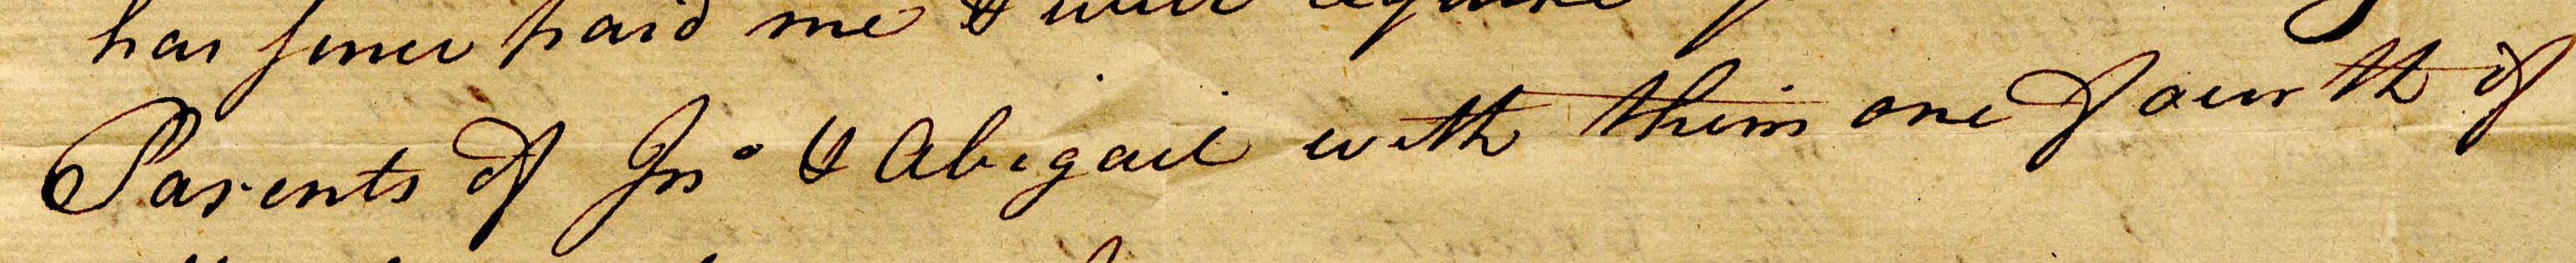Parents of Jn^o & Abigail with them one fourth of
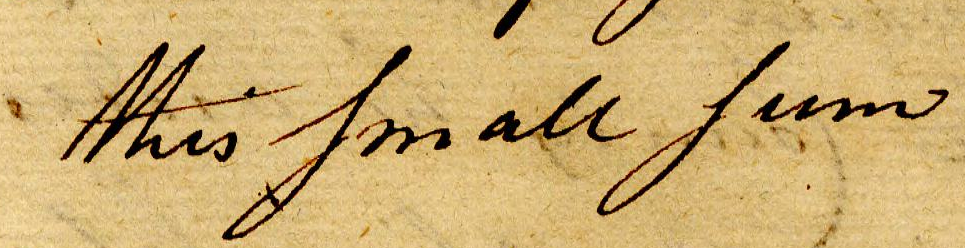this small sum
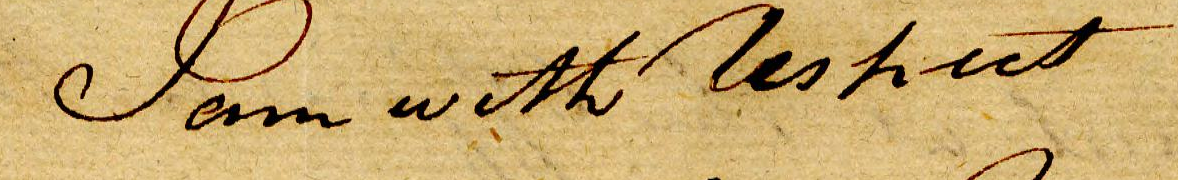I am with respect
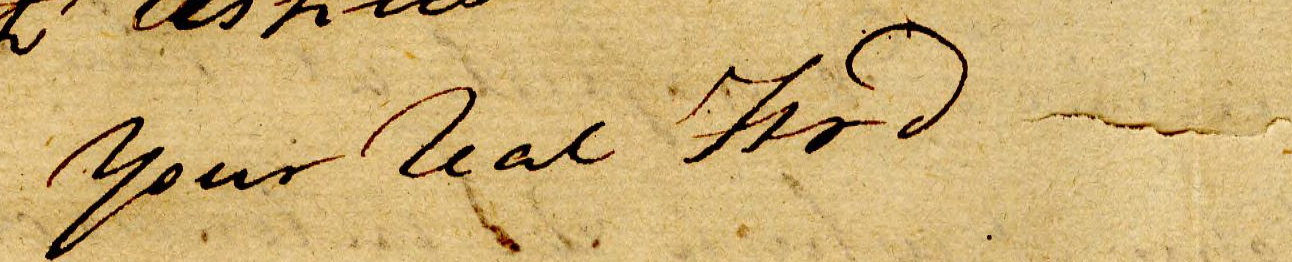your real Frd
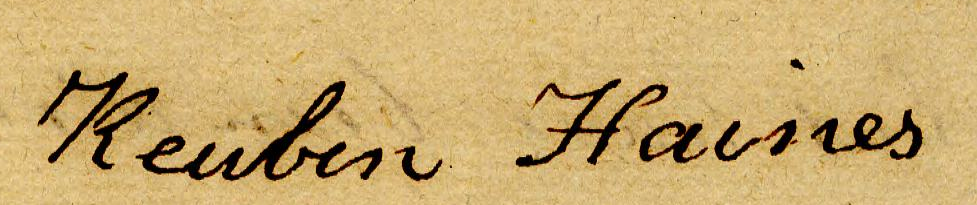Reuben Haines
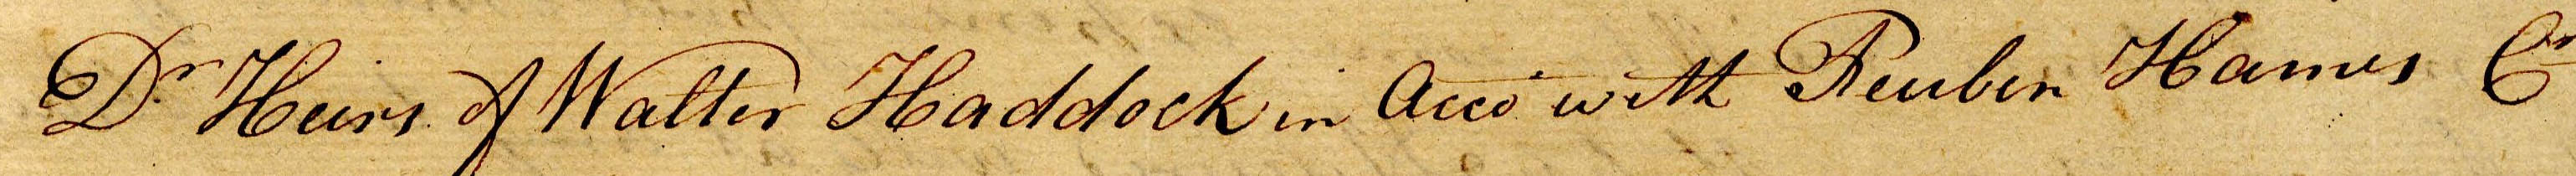D^r. Heirs of Walter Haddow in Acco^t with Reuben Haines C^r
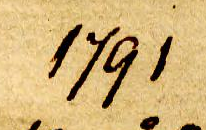1791
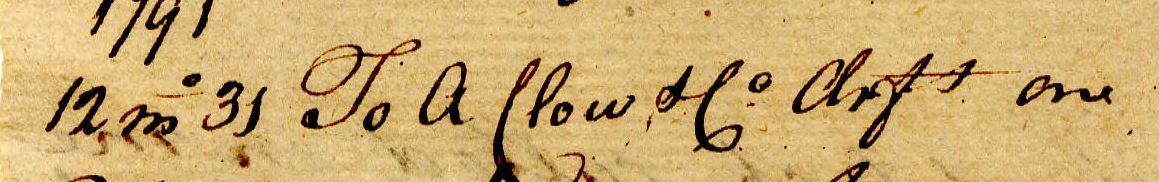12 m^o 31 To A Clow & C^o drft one
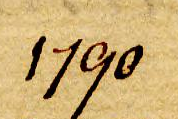1790
